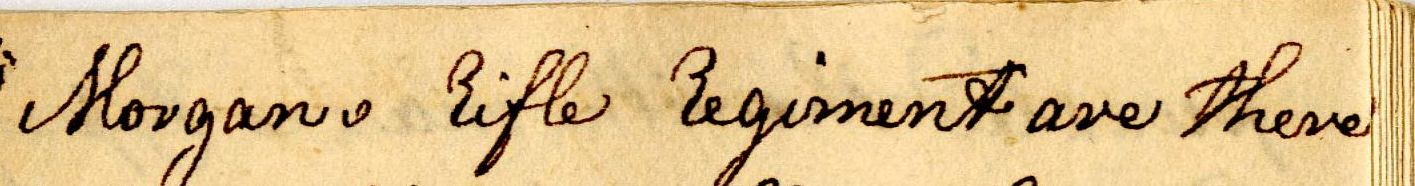Morgans rifle regiment are there
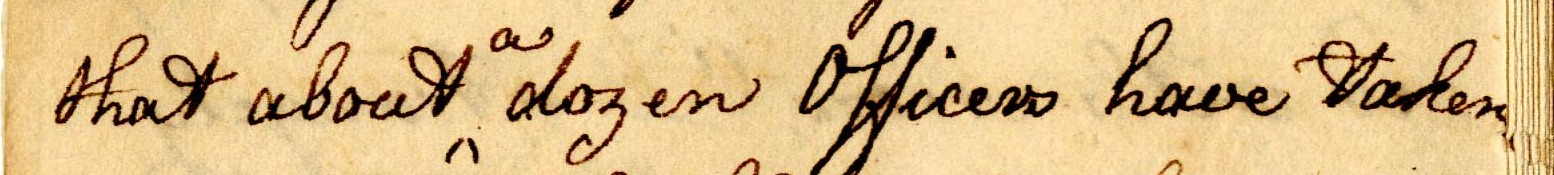that about ^a dozen Officers have taken
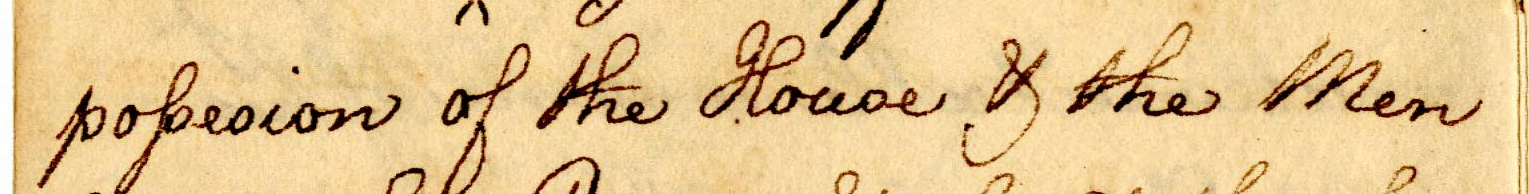possesion of the House & the Men
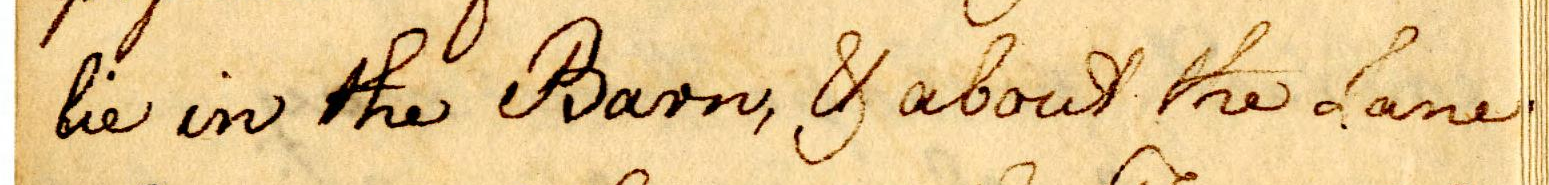lie in the Barn, & about the Lane
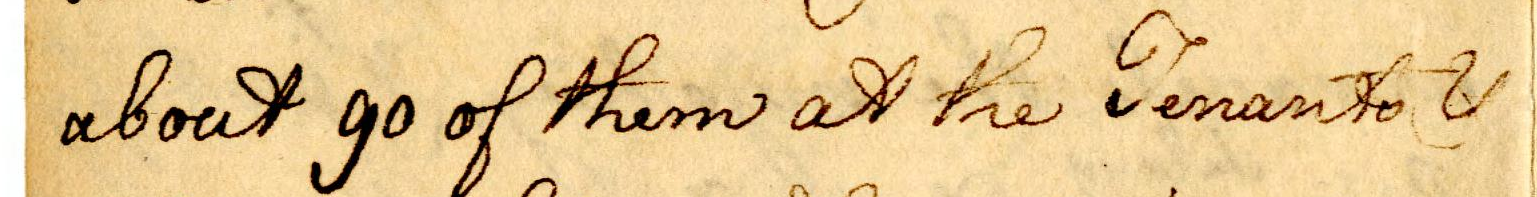about 90 of them at the Tenants &
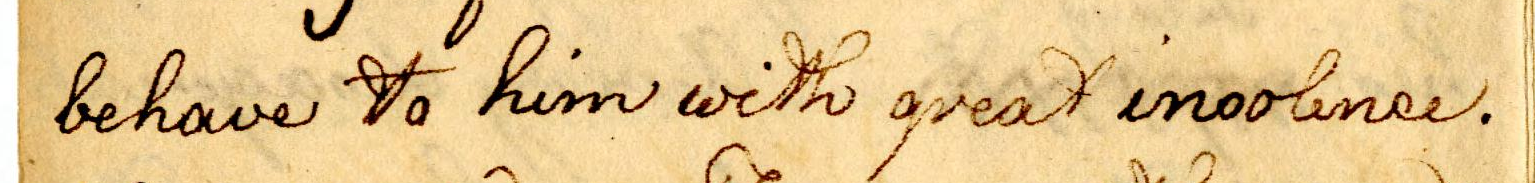behave to him with great insolence.
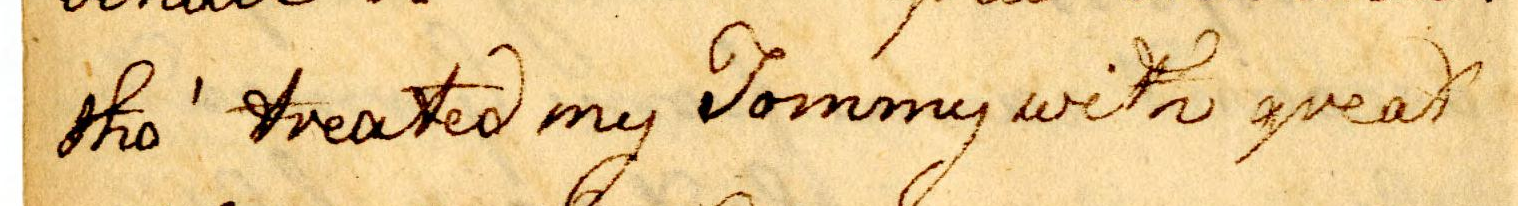tho' treated my Tommy with great
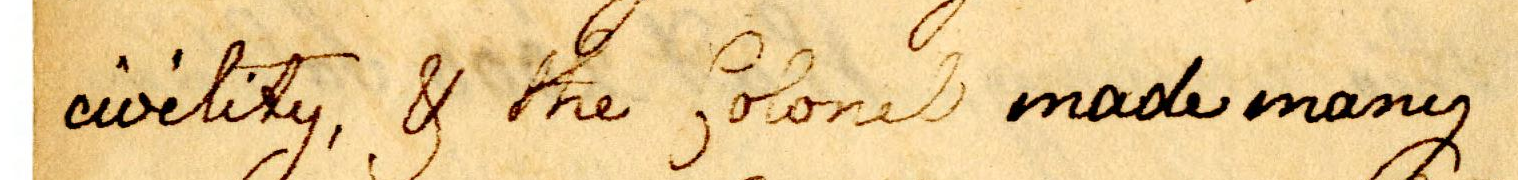civility, & the Colonel made many
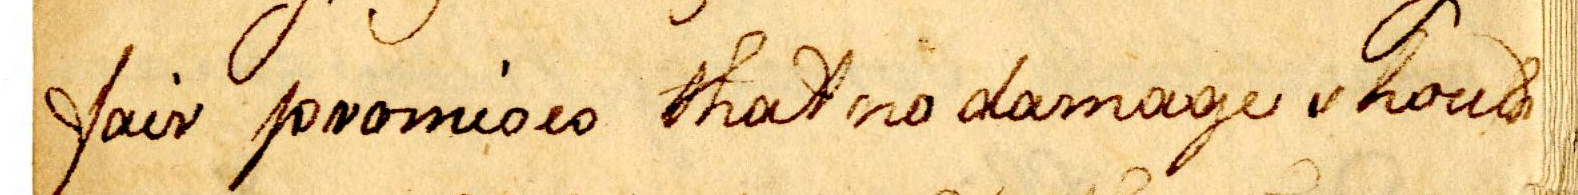fair promises that no damage should
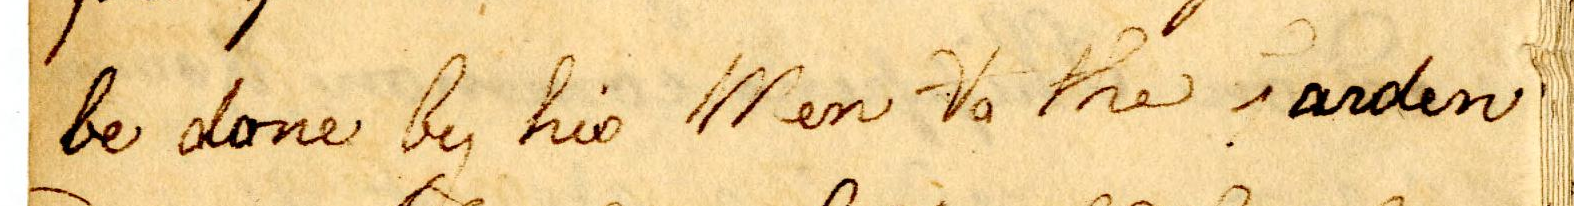be done by his Men to the Garden
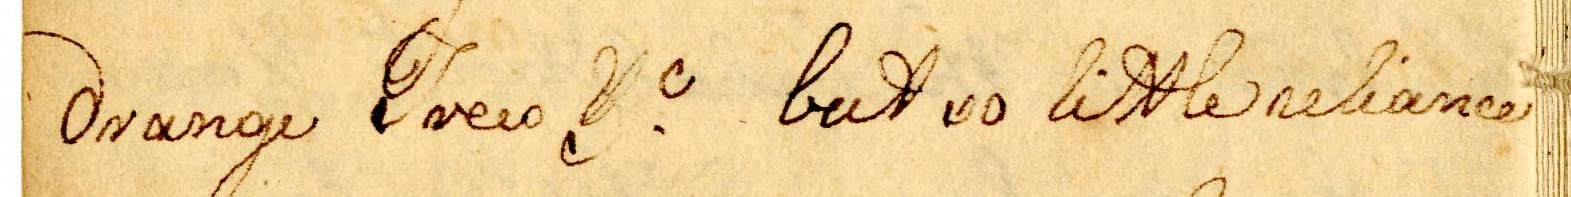orange Trees & ^c but so little reliance
